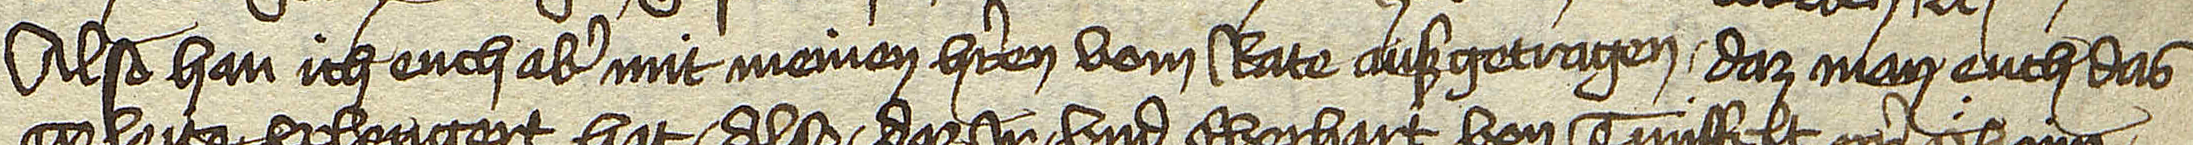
Alſo han ich euch ab* mit meinen h*ren vom Rate auſʒgetragen / daʒ man euch das
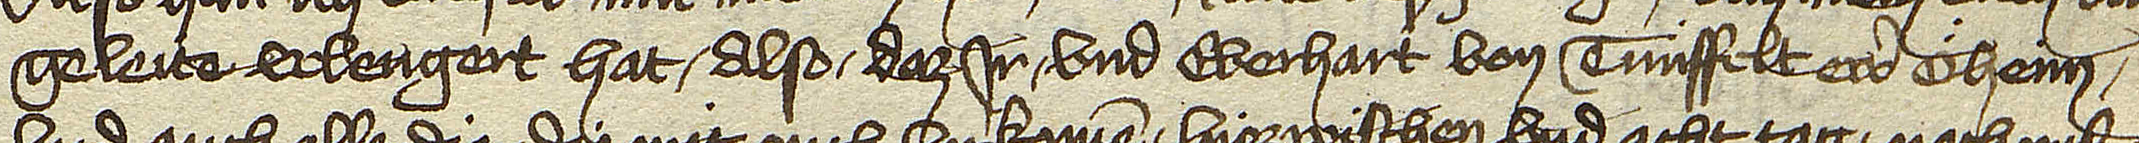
geleite erlengert hat / Alſo / daʒ Ir / vnd Eberhart von Tünffelt ew* Öheim /
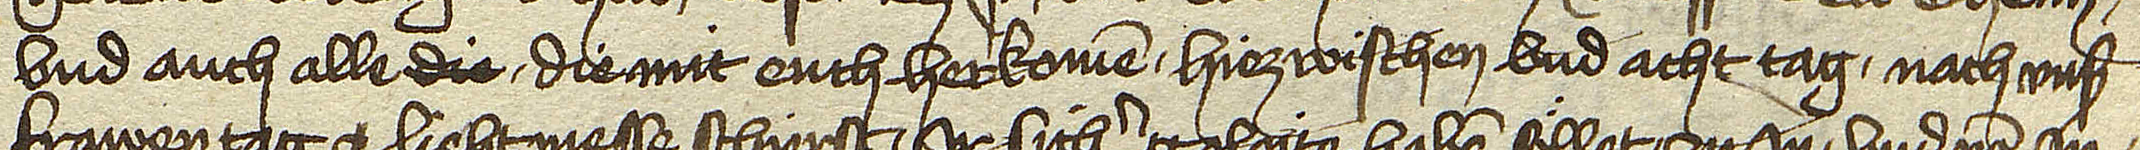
vnd auch alle die / die mit euch herkome* / hieʒwiſchen vnd acht tag / nach vnſ*
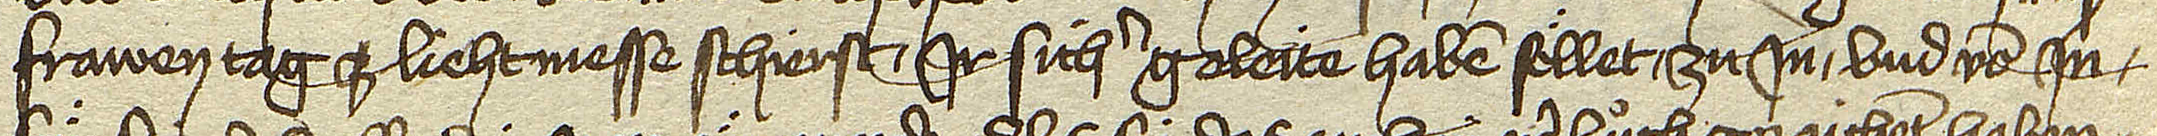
frawen tag cʒ liehtmeſſe ſchierſt / Ir ſich* geleite habe* ſöllet / cʒu In / vnd vo* In /
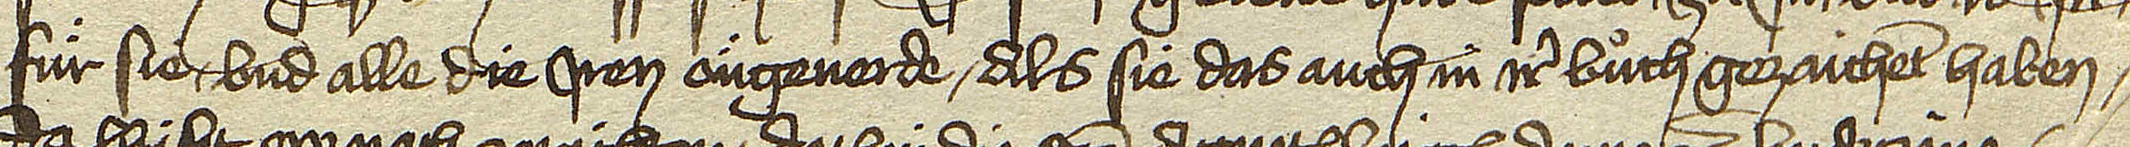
für ſie / vnd alle die Iren öngeuerde / Als ſie das auch in ir* büch geʒaichet* haben /
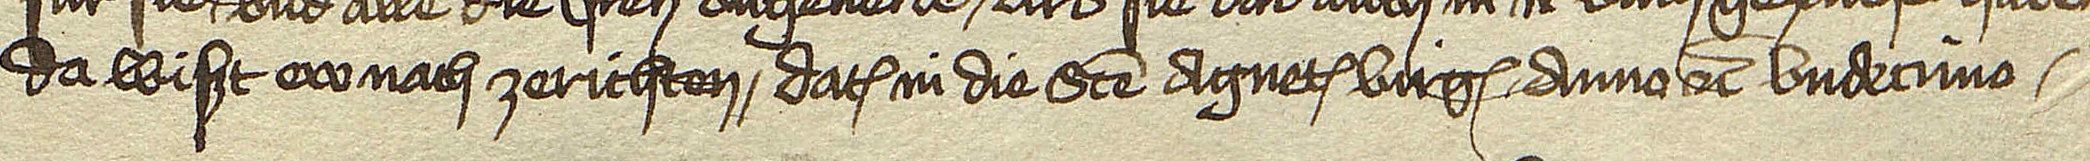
da wiſʒt ew nach cʒerichten / dat* in die Sce* Agnet* virg* / Anno ec* vndecimo /
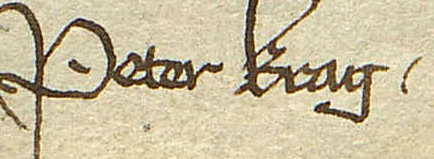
Peter Krag /
